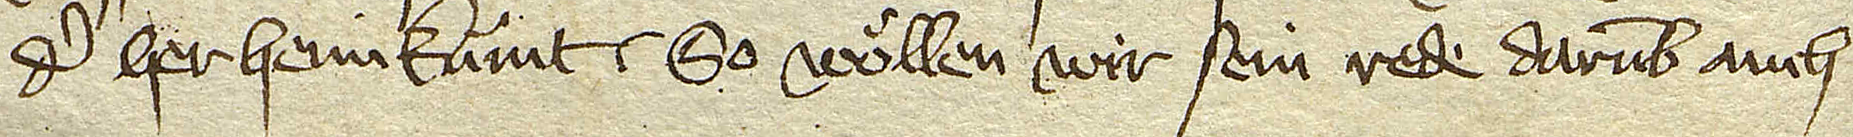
d* her heim kümt / So wöllen wir ſein rede darub* auch
